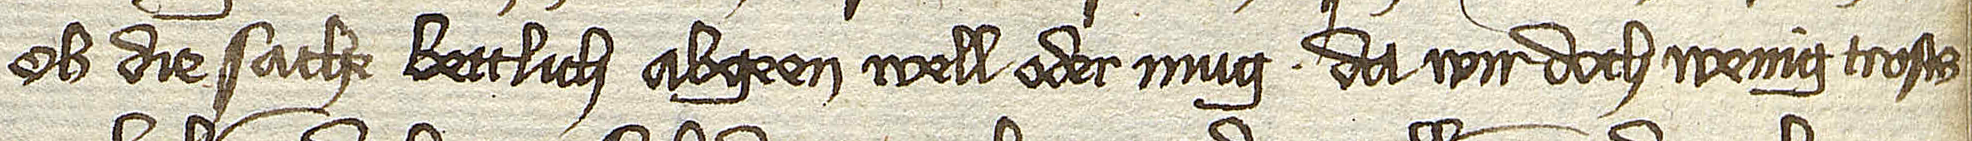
Ob die ſache bettlich abgeen well oder mug . da wir doch wenig troſts
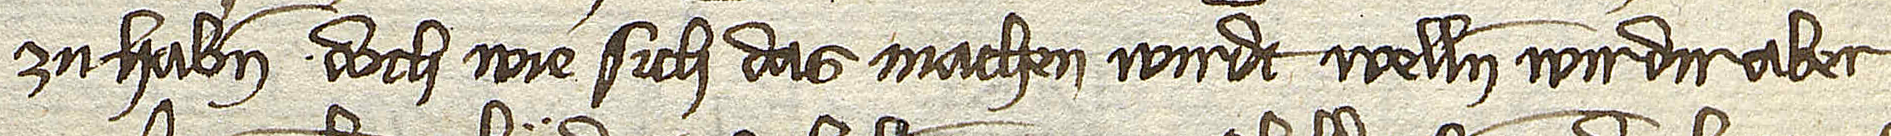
ʒu habn* . doch wie ſich das machen wirdt welln* wir dir aber
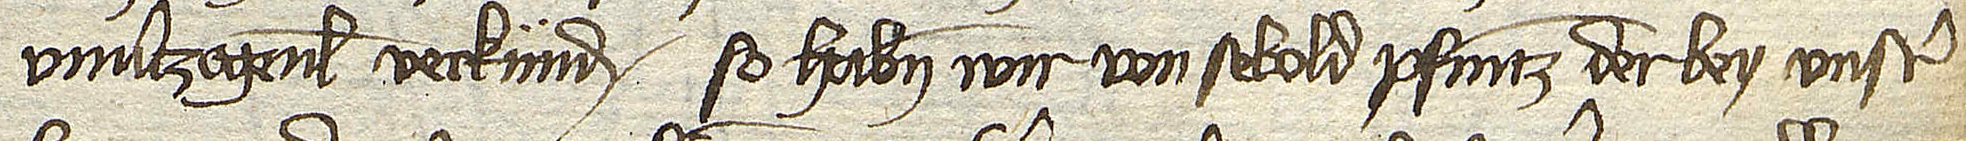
vnu*cʒogenl* verkünd* / ſo habn* wir von ſebold pfincʒ* der bey vnſr*
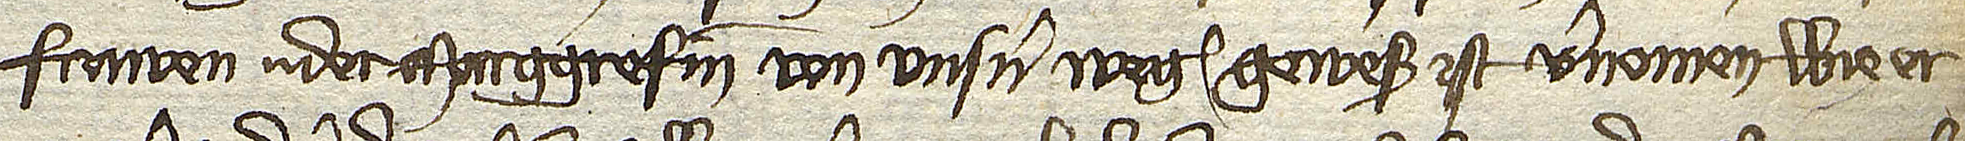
frawen ~ der Marggrefin* von vnſn* weg* geweſ* iſt v*nomen wie er
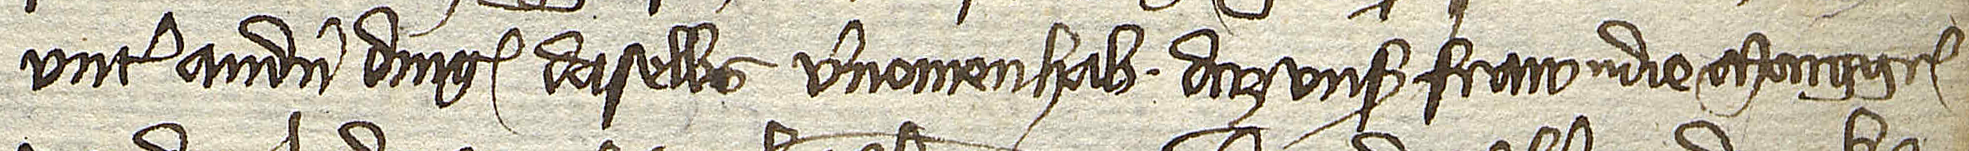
vnt* andn* ding* daſelbs v*nomen hab . daʒ vnſ* fraw ~ die Marggr*
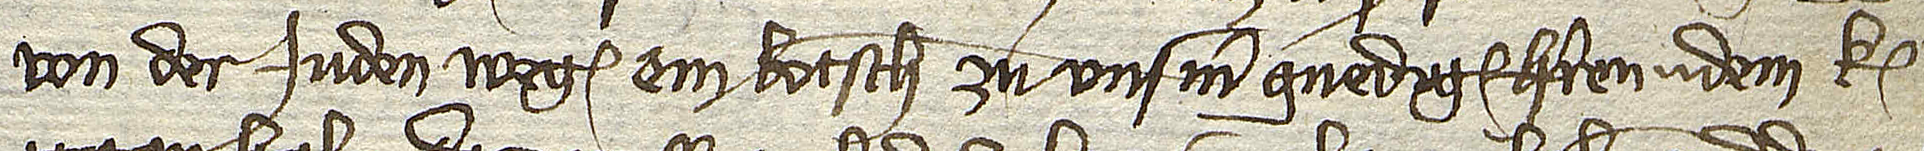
von der Iuden weg* ein botſch* ʒu vnſm* gnedig* h*ren ~ dem k*
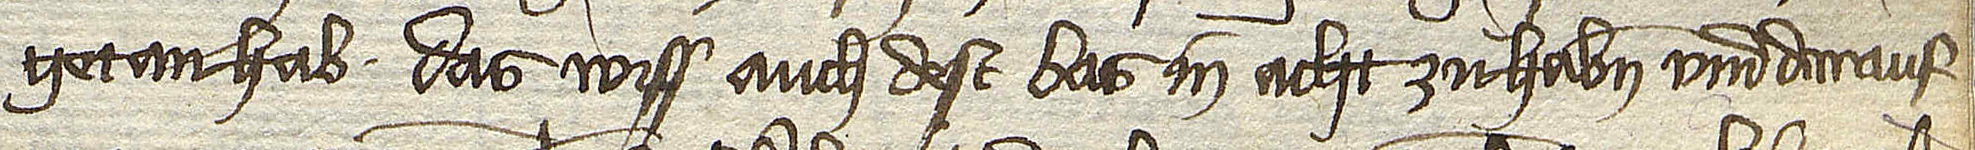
getan hab . Das wiſſ auch deſt bas in acht ʒu habn* vnd darauf
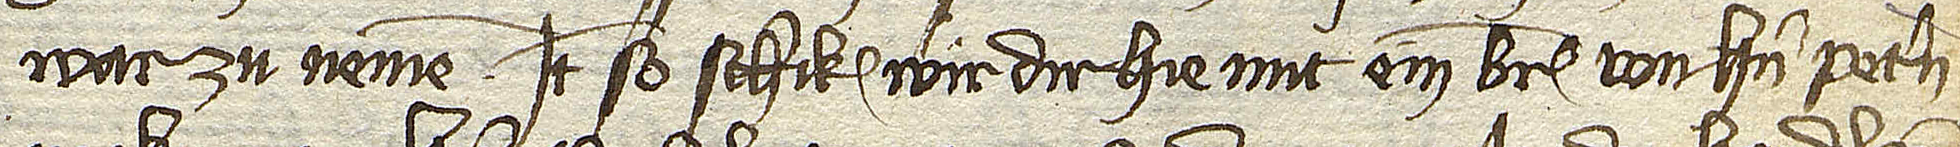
war ʒu neme* . It* ſo ſchik* wir dir hie mit ein* br* von hn* pet*n
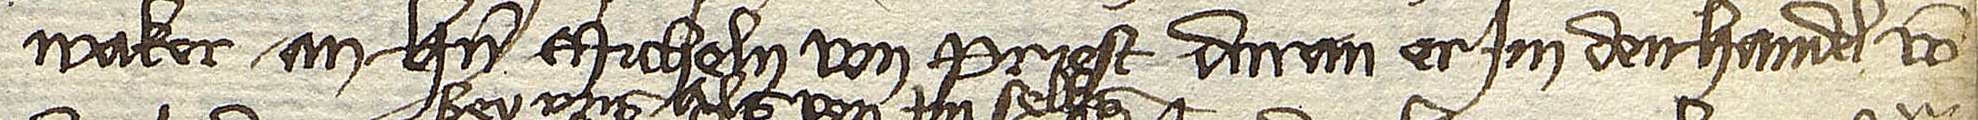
waker / an Hn* Micheln von Prieſt daran er Im den handel vo*
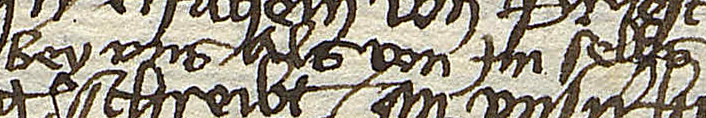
bey vns / als von Im ſelbs
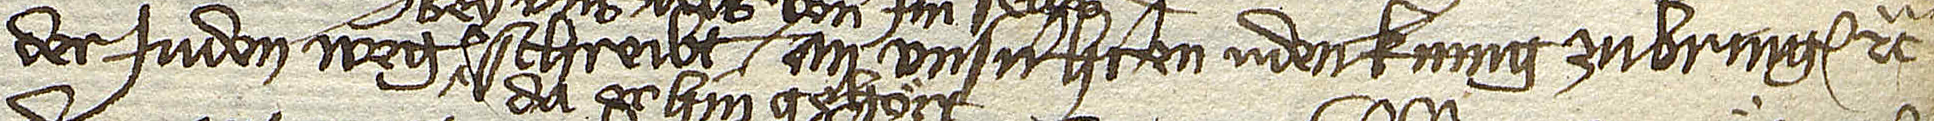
der Iuden weg* ſcheibt / an vnſn* h*ren ~ den kunig ʒu bring* ec*
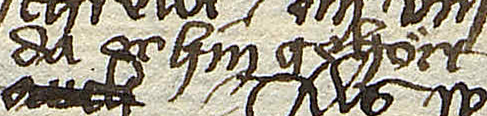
da er hin gehört
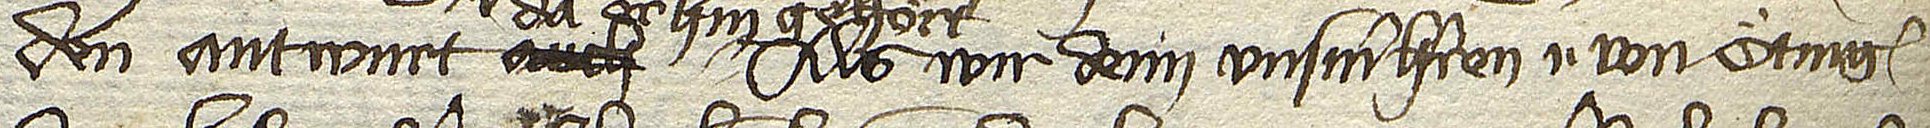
Den antwurt auch / Als wir denn vnſm* h*ren ~ von Öting*
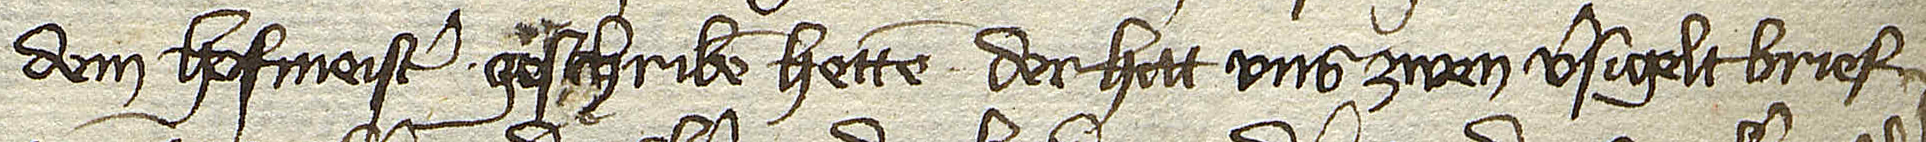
dem Hofmeiſt* . geſchribe* hette* der hat vns ʒwen v*ſigelt brief
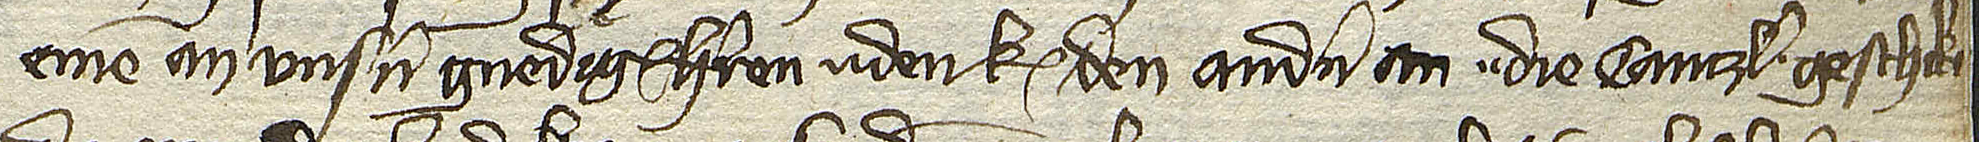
eine* an vnſn* gnedig* h*ren ~ den k* / den andn* an ~ die Cancʒl* geſchikt
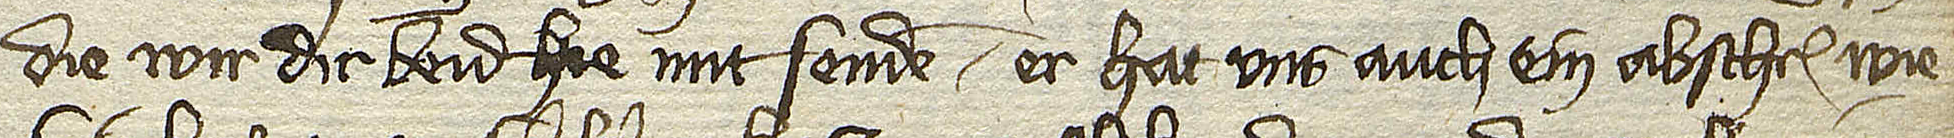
die wir dir beid hie mit ſende* / er hat vns auch ein abſchr* wie
